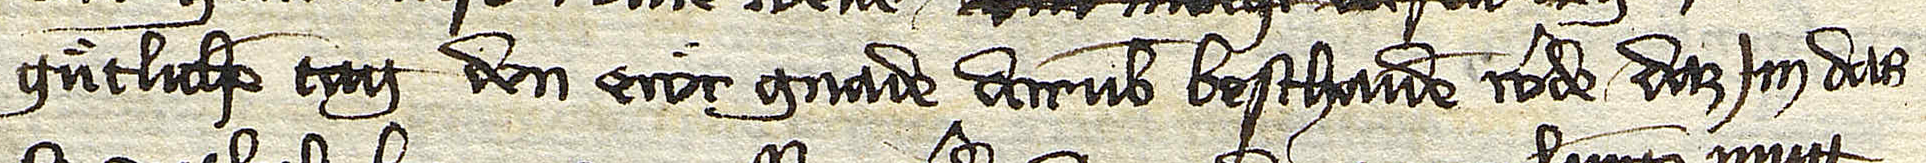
gütliche* tag den ewr gnade darub* beſchaide* w*de / daʒ Im das
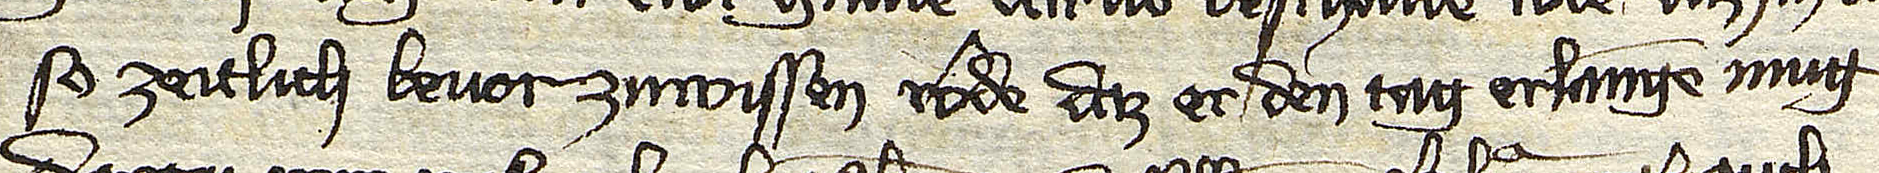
ſo ʒeitlich beuor ʒuwiſſen w*de daʒ er den tag erlange* mug
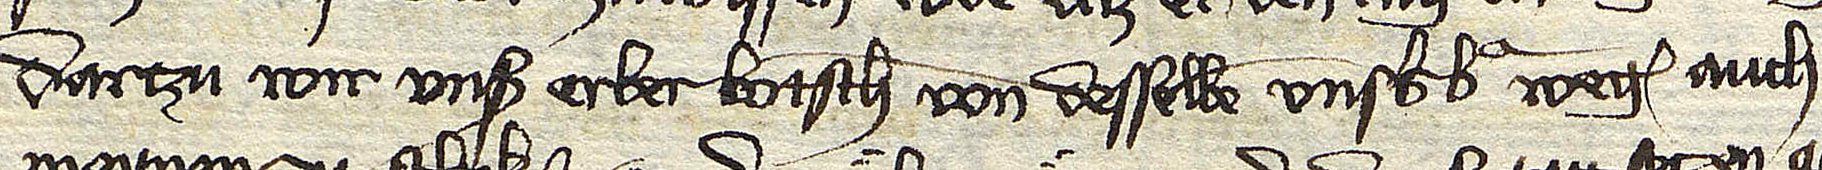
Darcʒu wir vnſ* erber botſch* von deſſelbe* vnſ*s b* weg* auch
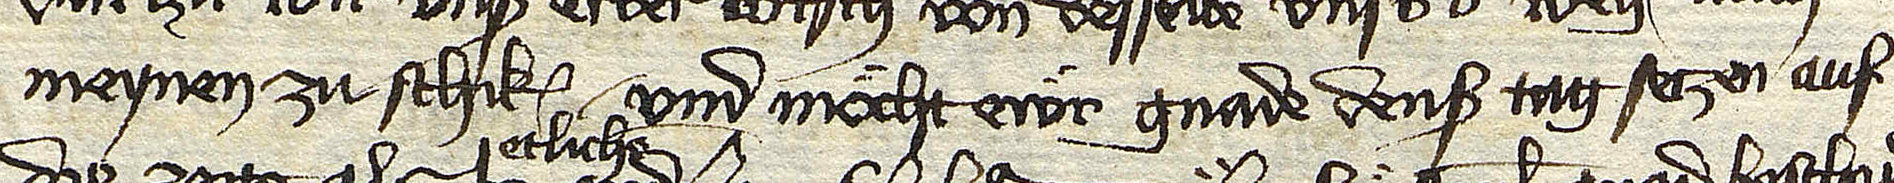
meynen ʒu ſchik* / vnd möcht ewr gnade denſ* tag ſecʒen auf
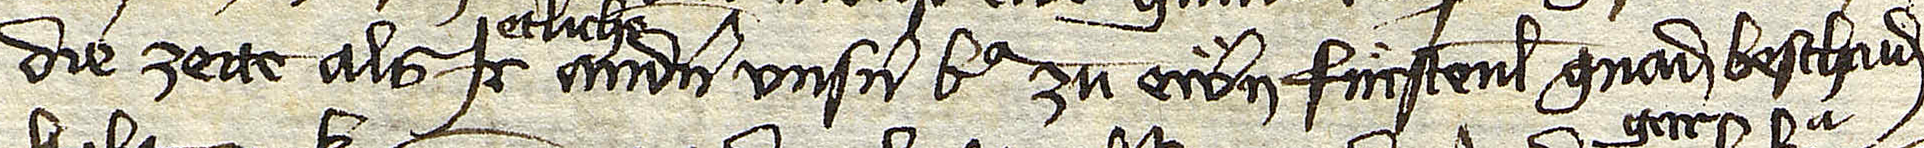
die ʒeite als Ir and*n vnſ*n b* ʒu ew*n fürſtenl* gnad* beſchaid*
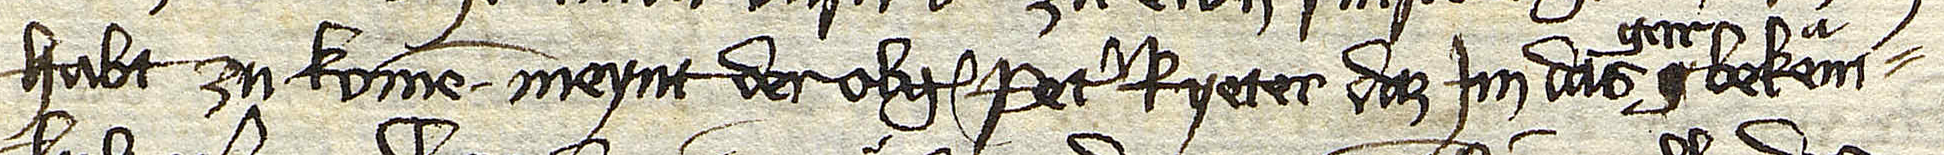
habt ʒu kome* . meynt der obg* Pet* Ryeter daʒ Im das bekëm =
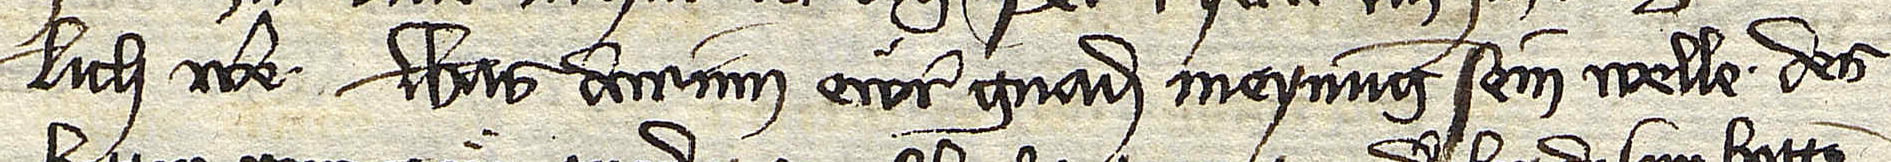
lich w*e / Was darinn ewr* gnad* meynu*g ſein welle . des
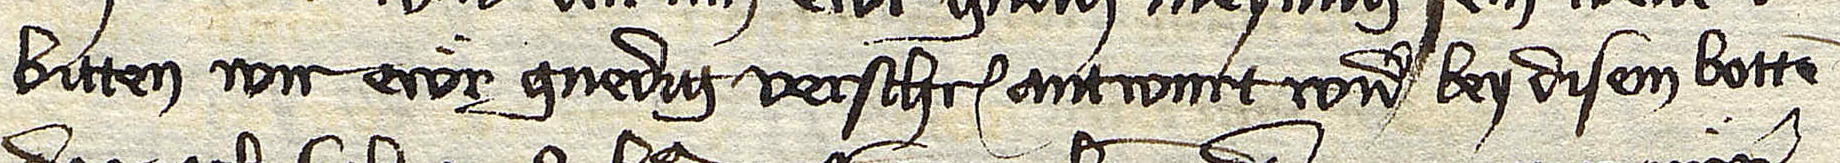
bitten wir ewr gnedig verſchr* antwurt wid* bey diſem botte*
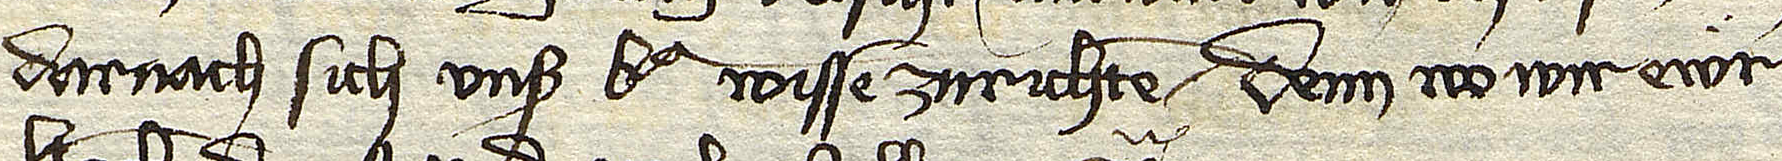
darnach ſich vnſ* b* wiſſe* ʒurichte* / Denn wo wir ewr*
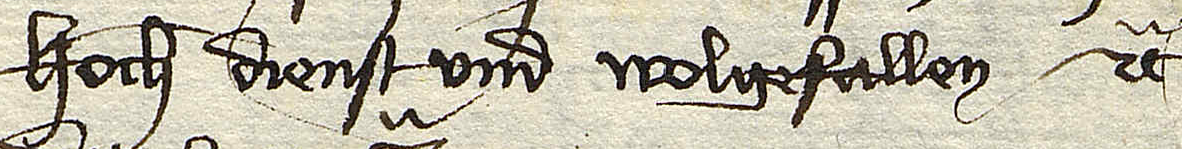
hoch* dienſt vnd wolgefallen ec*
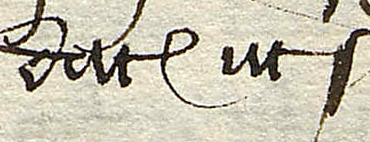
Dat* ut ſ*
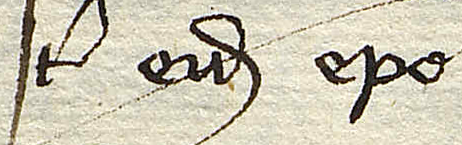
It* eid* epo*
